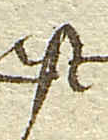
eſt
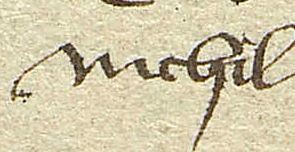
nichil
